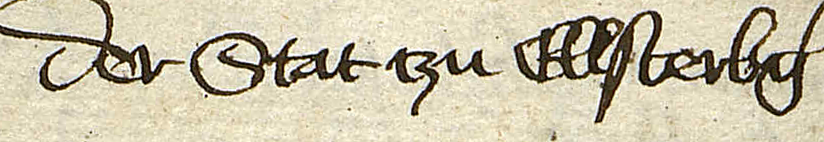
Der Stat cʒu Ellſterb*g
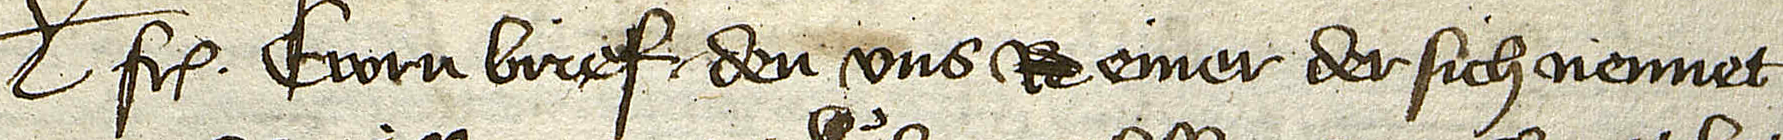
L* fr* Ewrn brief / den vns Re einer der ſich nennet
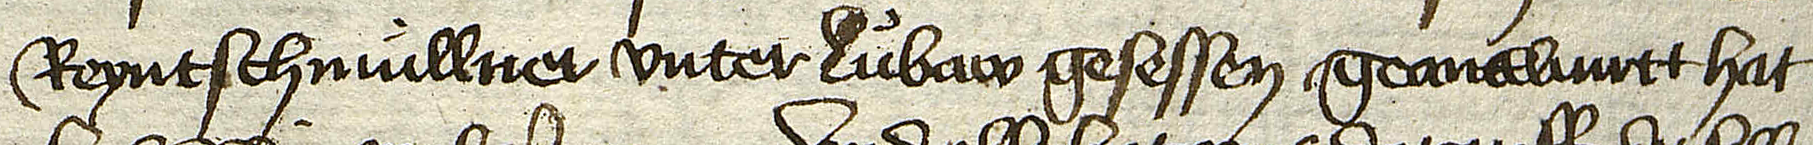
Reyntſchmüllner vnter Lübaw geſeſſen / geantwurtt hat
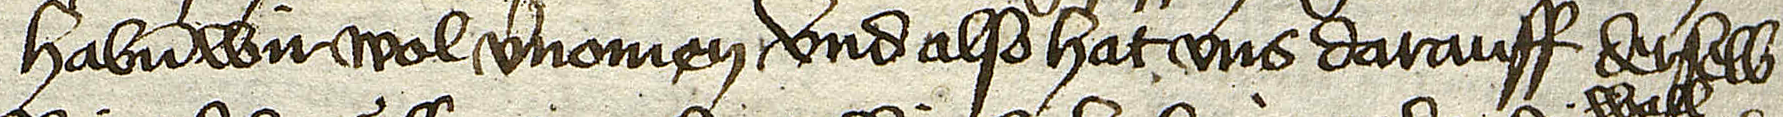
hab*n wir wol v*nomen / Vnd alſo hat vns darauff derſelb
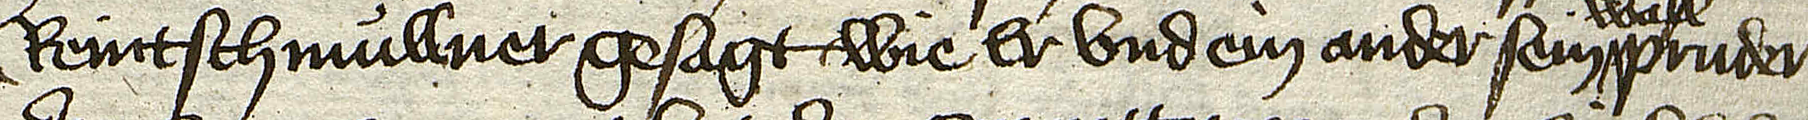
Reintſchmüllner geſagt / wie Er vnd ein ander ſein pruder
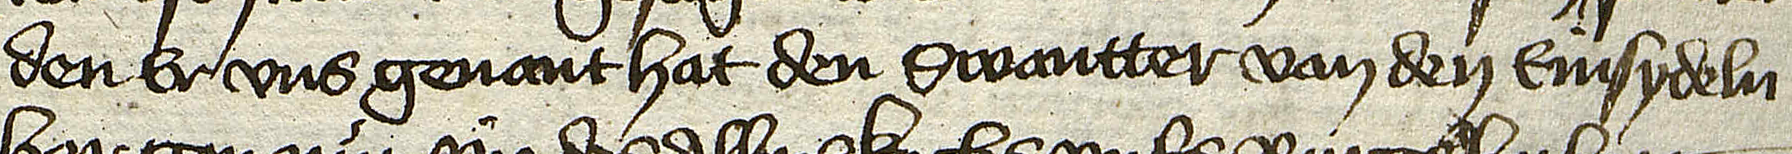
den Er vns genant hat den Swantter von den Einſydeln
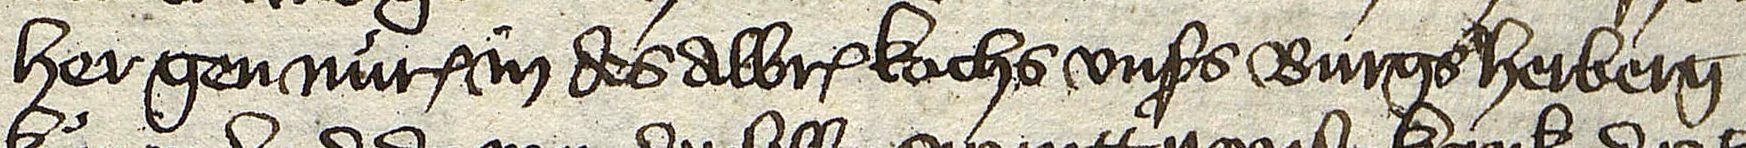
her gen Nür* in des Albr* kochs vnſ*s Burg*s herberg
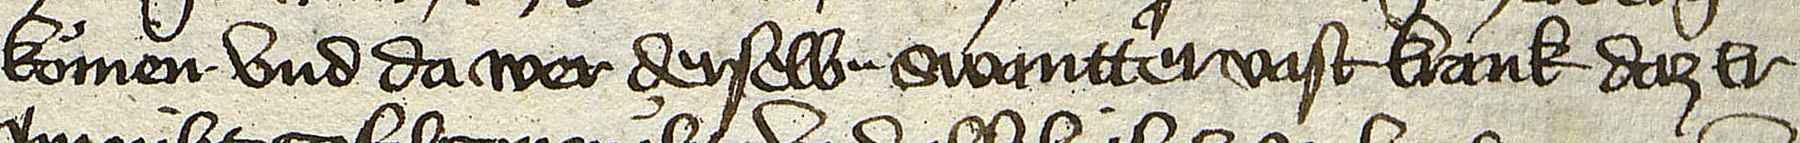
kömen . vnd da wer derſelb . Swantter vaſt krank daʒ Er
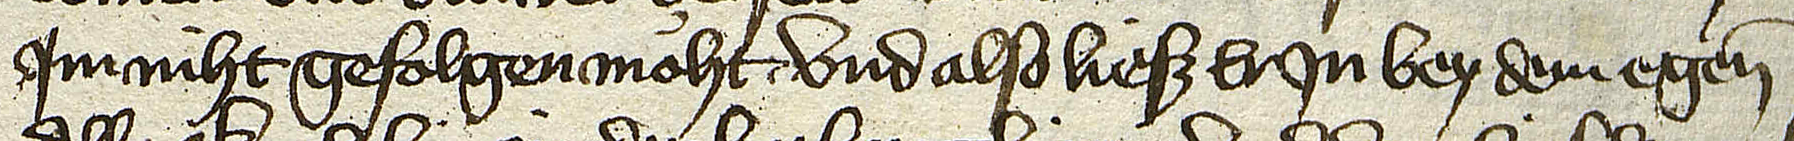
Im niht gefolgen möht / Vnd alſo lieſʒ Er In bey dem egen*
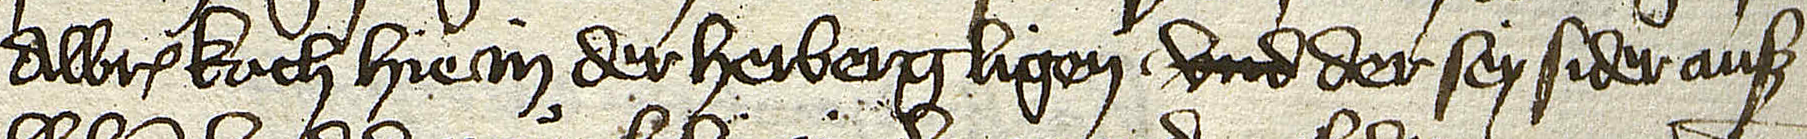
Albr* Koch hie in der herberg ligen / Vnd der ſey ſider auſʒ
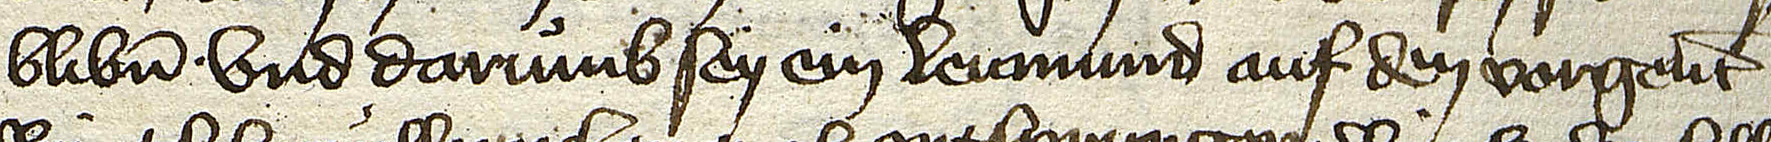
blib*n . Vnd darümb ſey ein leumund auf den vorgen*t
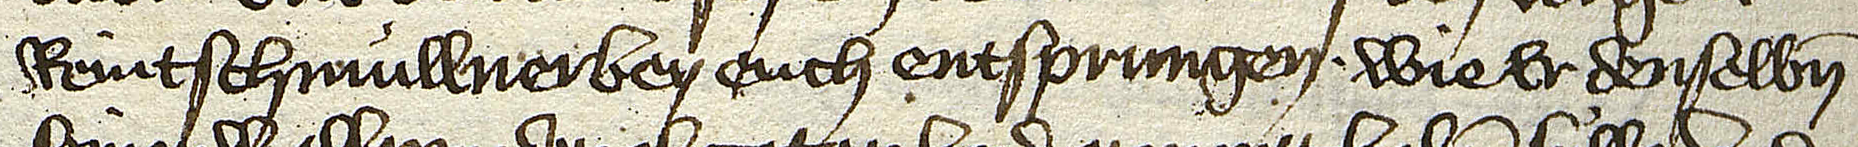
Reintſchmüllner bey euch entſprungen . wie Er denſelb*n
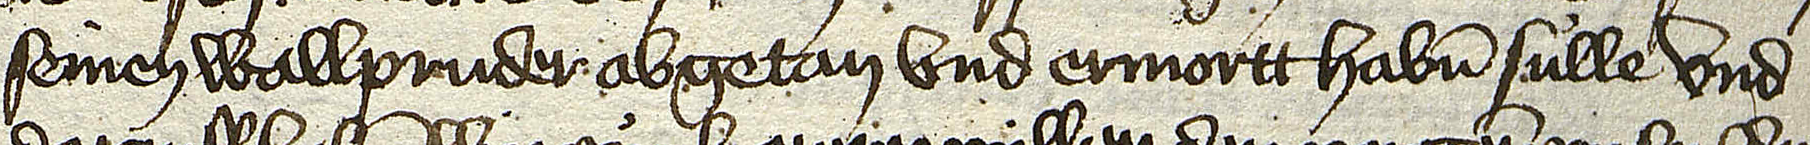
ſeinen wallpruder abgetan vnd ermortt hab*n ſülle Vnd
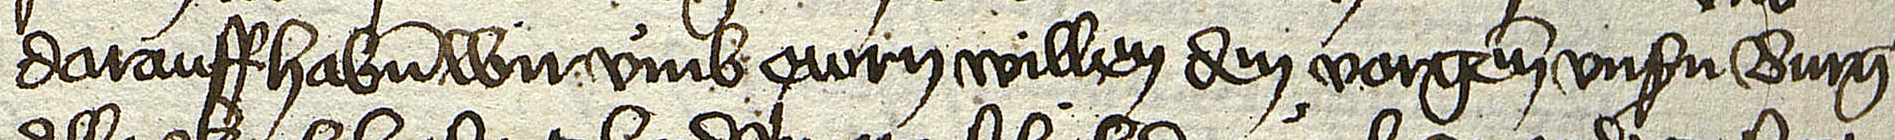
darauff hab*n wir v̈mb ewrn willen den vorgen* vnſ*n Burg*
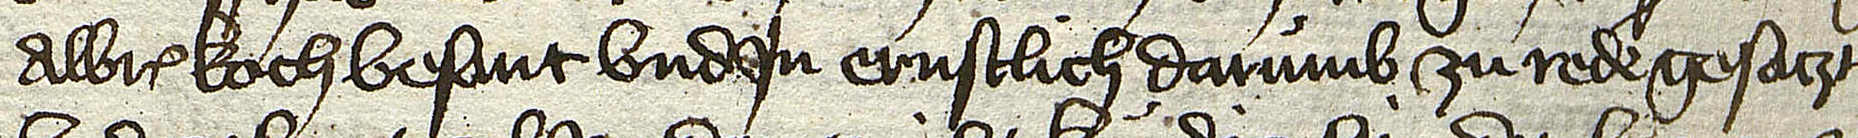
Albr* Koch beſant vnd In ernſtlich darümb ʒu rede geſacʒt
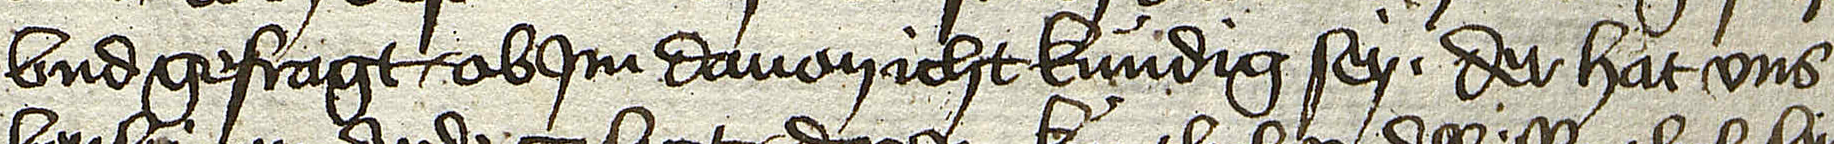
vnd gefragt / ob In dauon icht kündig ſey . der hat vns
